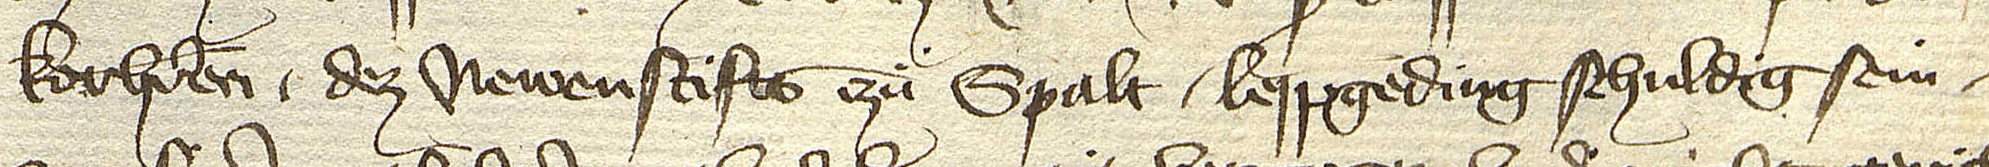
korhr*en / deʒ Newenſtifts cʒü Spalt / leppgeding ſchuldig ſein /
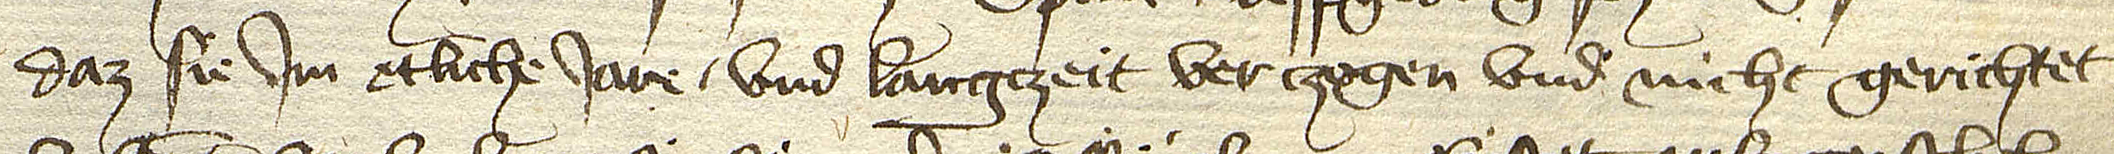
daʒ ſie Im etliche Iare / vnd langcʒeit ver cʒogen vnd nicht gerichtet
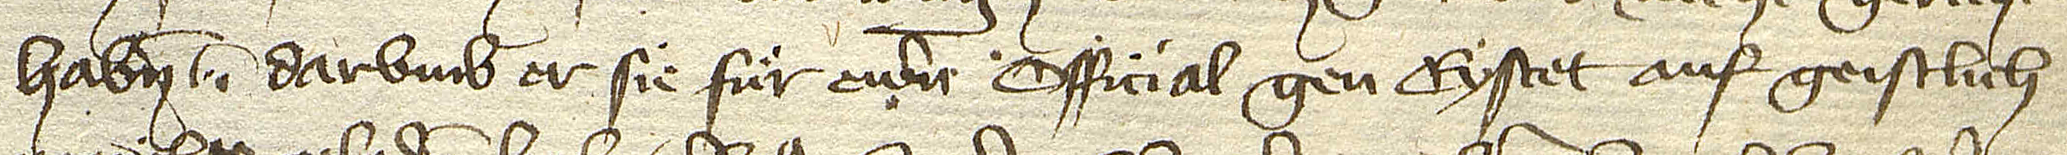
habn* / . darvmb er ſie für ewn* Official gen Eyſtet auf geiſtlich
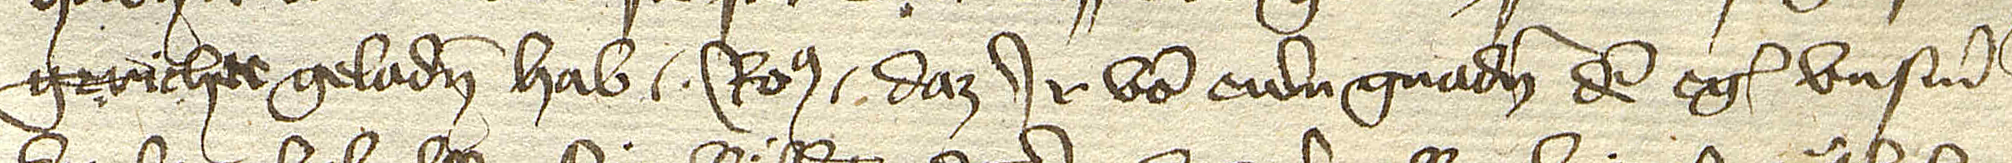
gerichte geladn* hab / . Ro* / daʒ Ir vo* ew*n gnadn* de* eg* vnſ*m
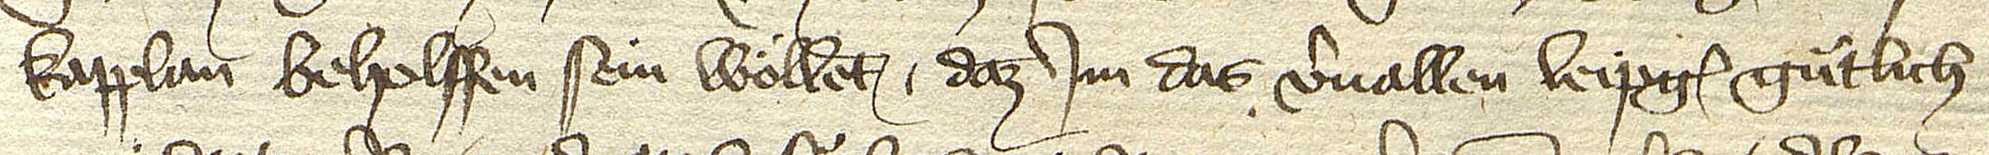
kapplan beholffen ſein wöllet / daʒ Im das v*uallen leipg* gütlich
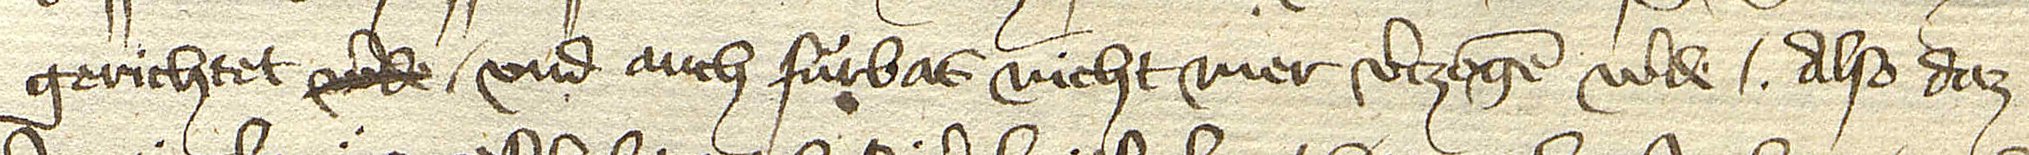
gerichtet w*de / vnd auch fürbas nicht mer v*cʒoge* w*de / . Alſo daʒ
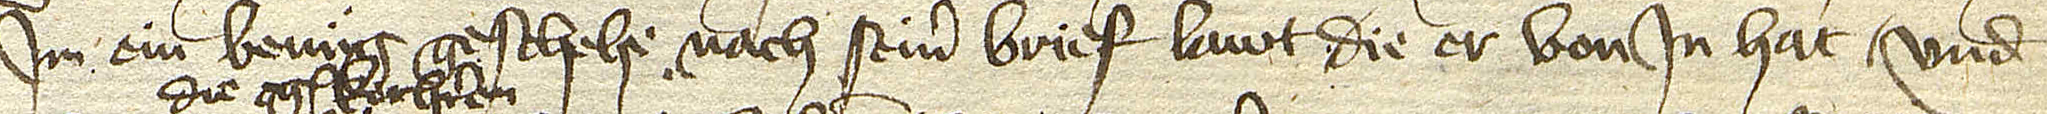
Im ein benüg geſchehe nach ſein* brief lawt die er von In hat / vnd
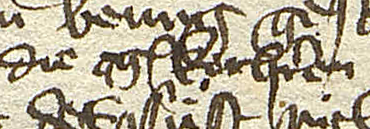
die eg* korhr*en
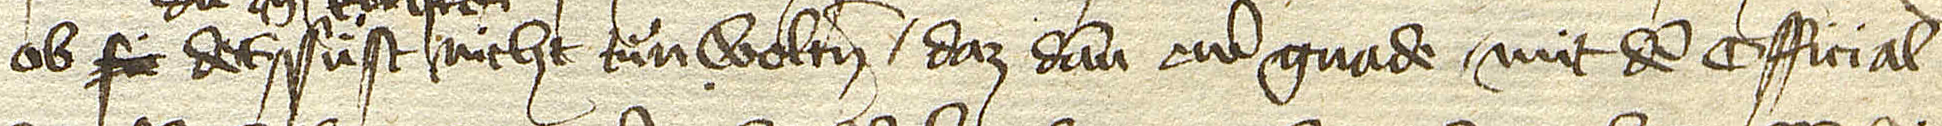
ob ſie des ſüſt nicht tün woltn* / daʒ dan* ew* gnade / mit de* Official
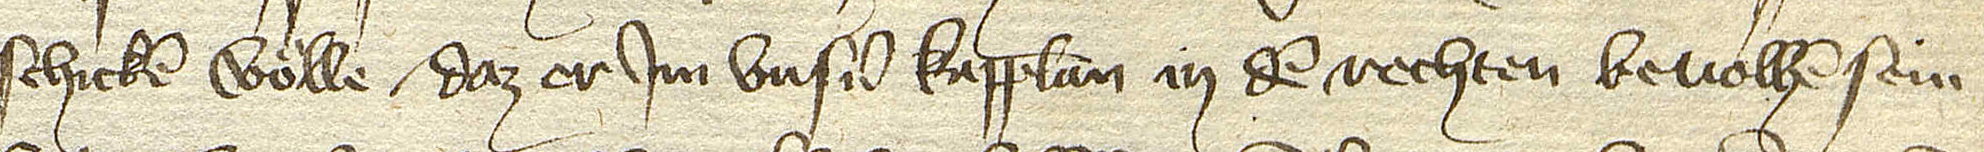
ſchicke* wölle / daʒ er Im vnſn* kapplan in de* rechten beuolhe* ſein
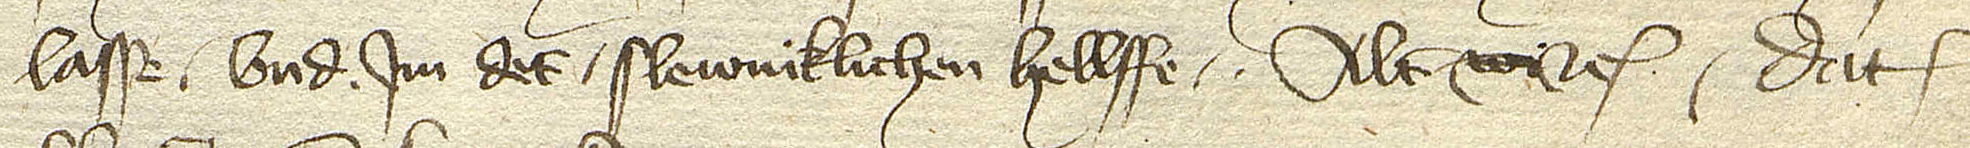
laſſe / vnd Im des / ſlewniklichen hellffe / . Als wi ec* / Dat*
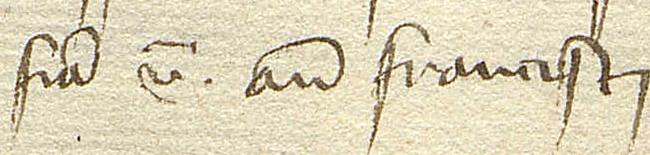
fia* v* . an* franciſci
